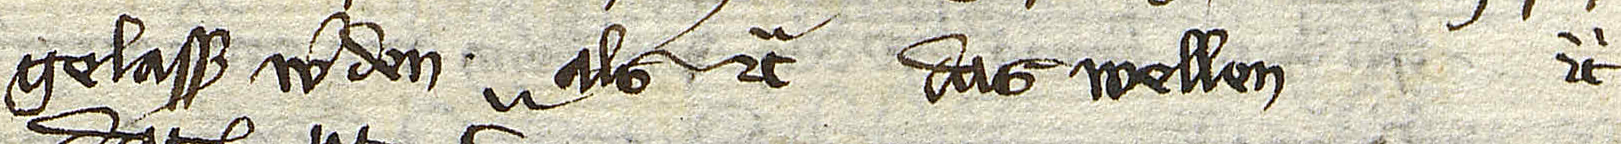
gelaſſ* w*den . als ec* das wellen ec*
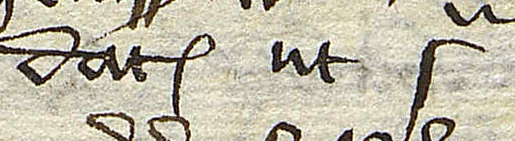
Dat ut ſ*
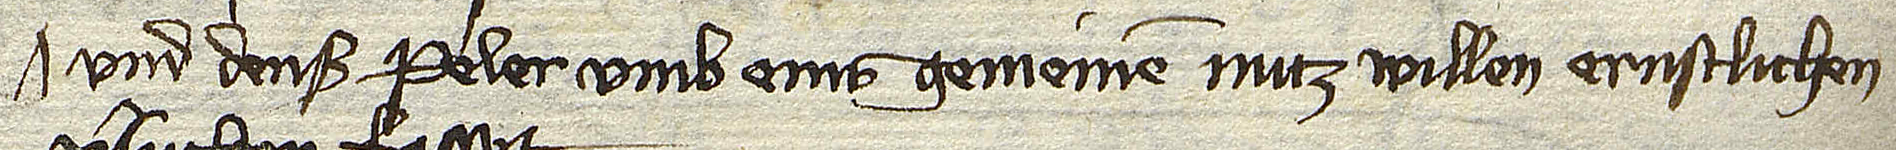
vnd denſ* Peler vmb eins gemeine* nucʒ willen ernſtlichen
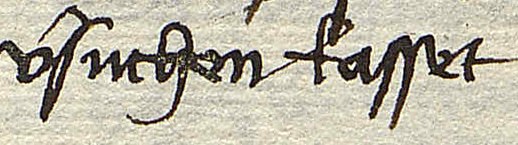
v*ſuchen laſſet
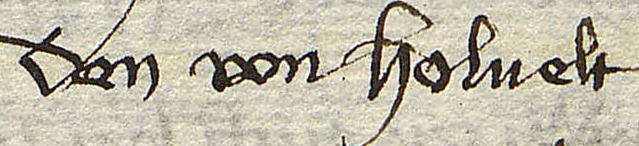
Den von Holuelt
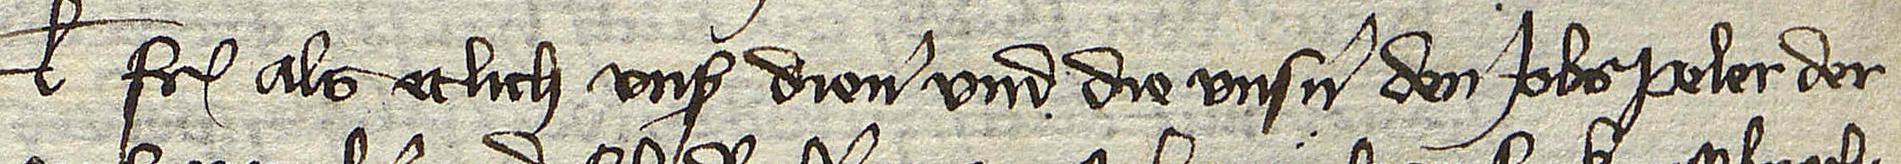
L* fr* als etlich vnſ* dien* vnd die vnſ*n den Iobs Peler der
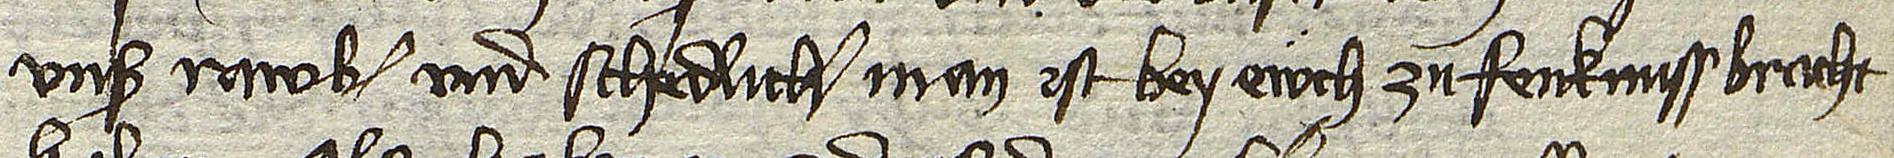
vnſ* rawb* vnd ſchedlich* man iſt bey ewch ʒu fenknuſſ bracht
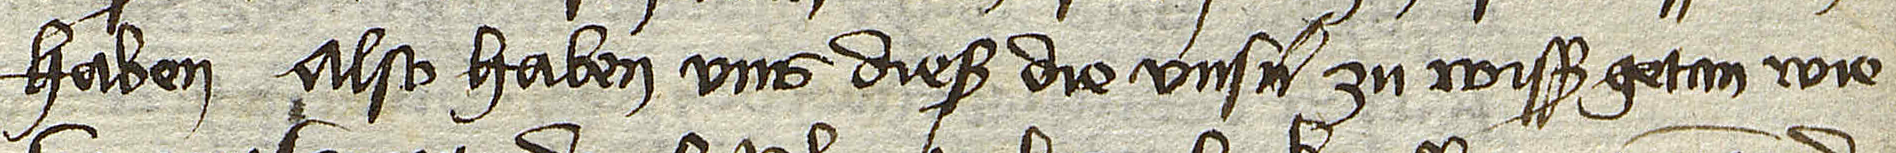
haben alſo haben vns dieſ* die vnſ*n ʒu wiſſ* getan wie
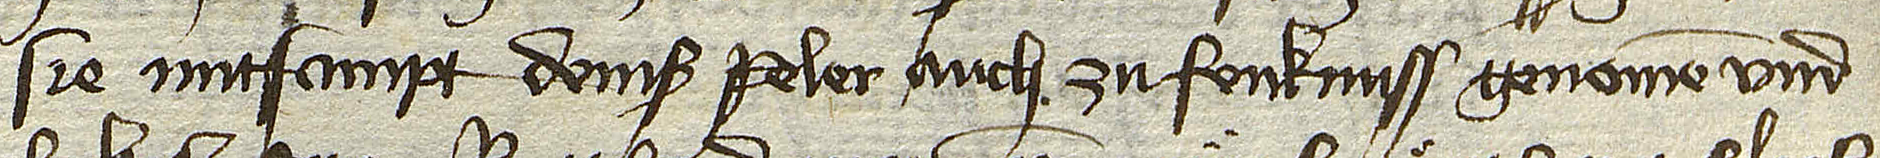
ſie mitſampt demſ* Peler auch ʒu fenknuſſ genome* vnd
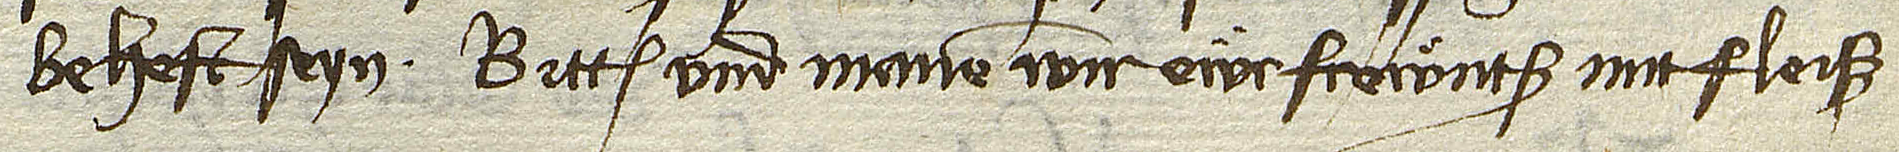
beheft ſeyn . Bitt* vnd mane* wir ewr frewntſ* mit fleiſʒ
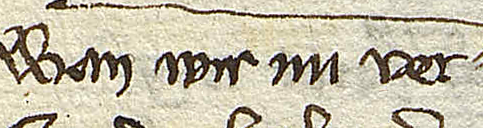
wan wir nu ver =
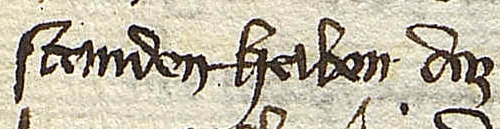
ſtanden haben . daʒ
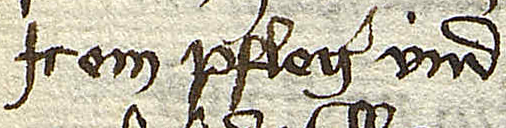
Ir ein pfleg* vnd
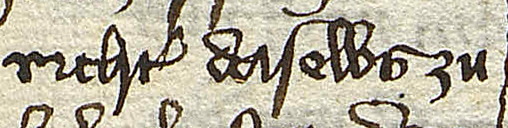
richt* daſelbs ʒu
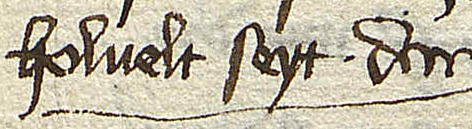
holuelt ſeyt . dar
